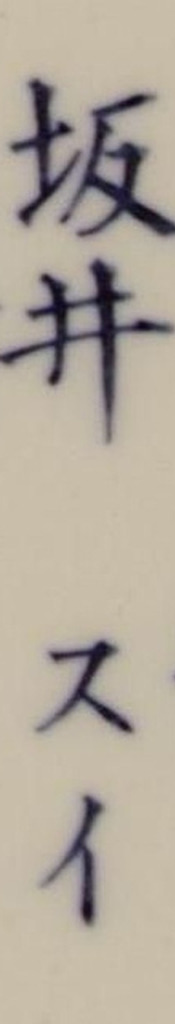坂井スイ
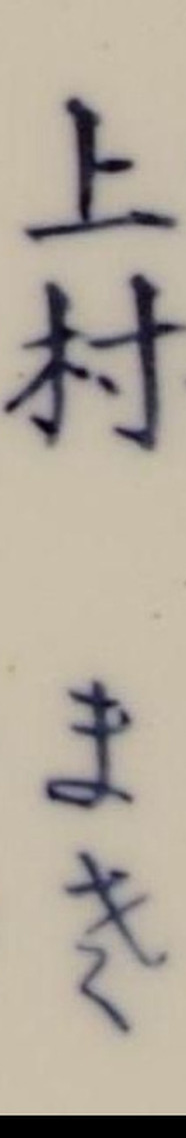上村まさ
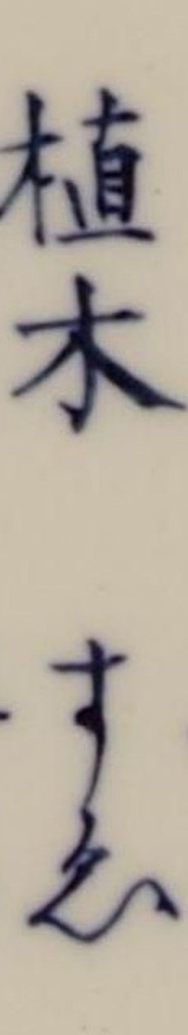植木すえ
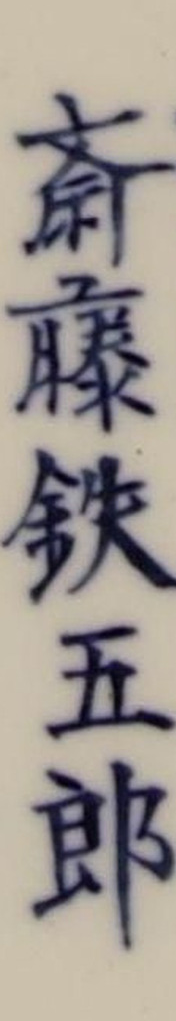斎藤鉄五郎
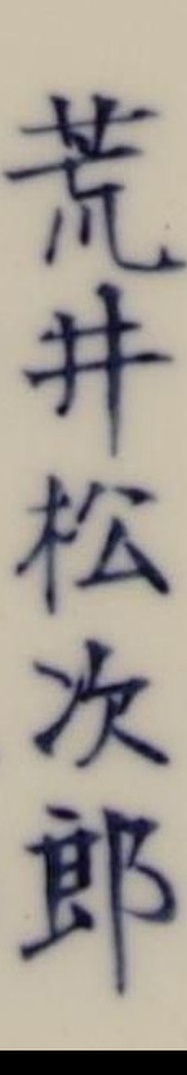荒井松次郎
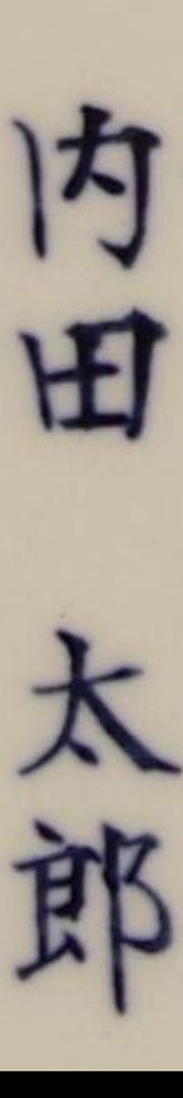内田太郎
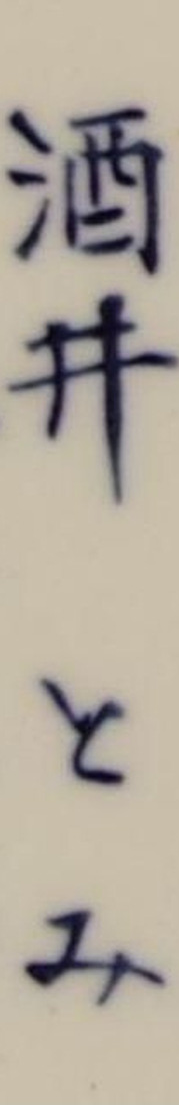酒井とみ
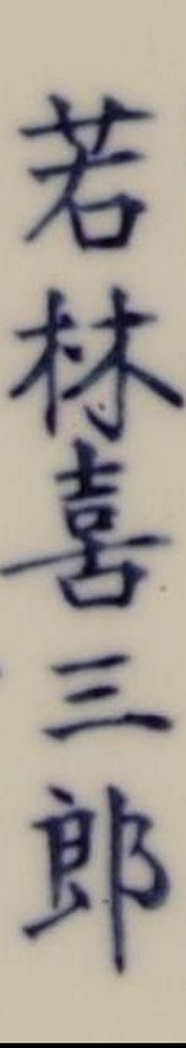若林喜三郎
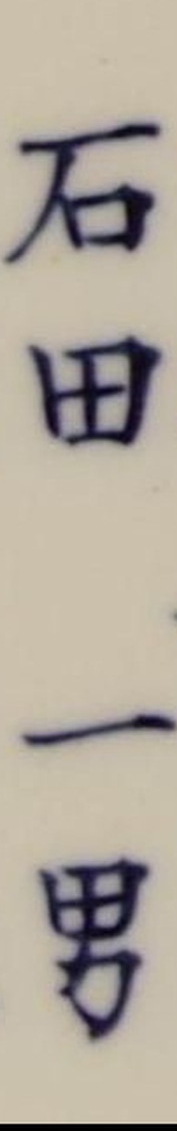石田一男
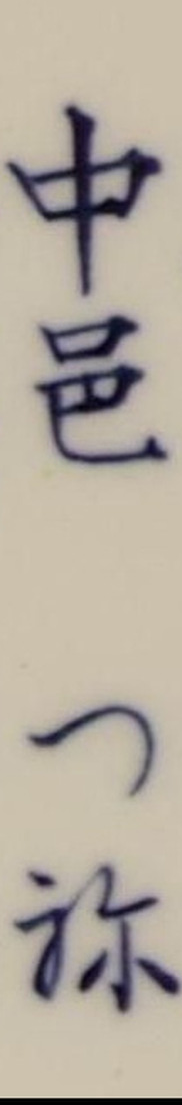中邑つね
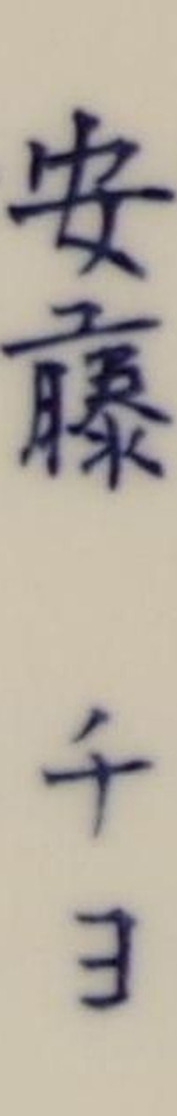安藤チヨ
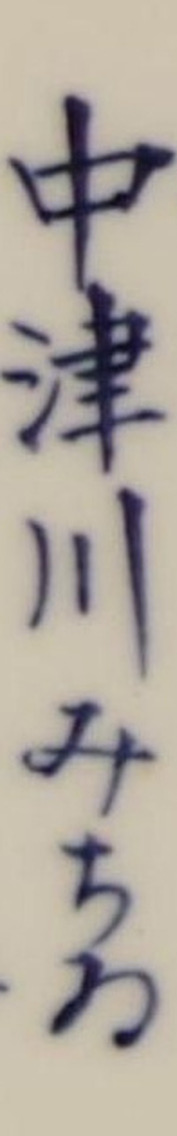中津川みちゐ
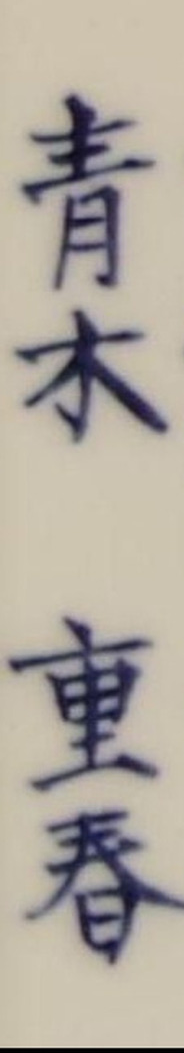青木重春

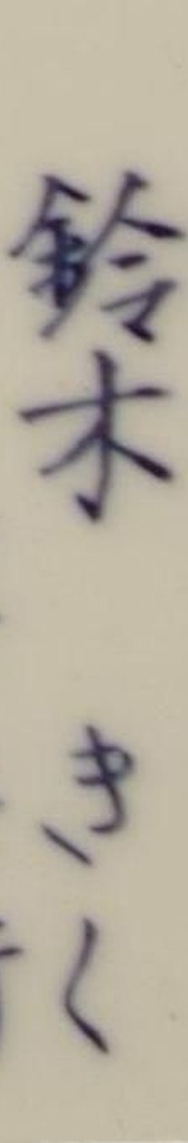鈴木きく
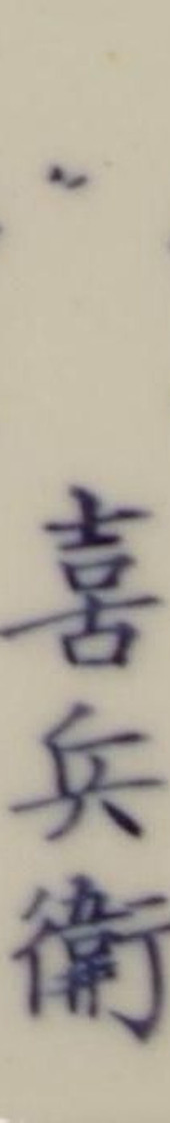喜兵衛
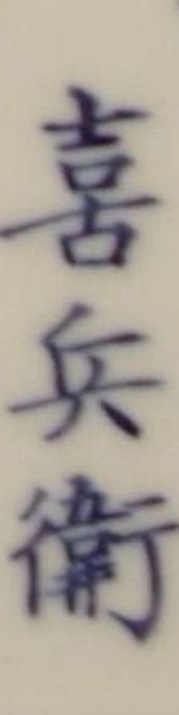喜兵衛
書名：E~L
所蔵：高野山金剛峯寺
